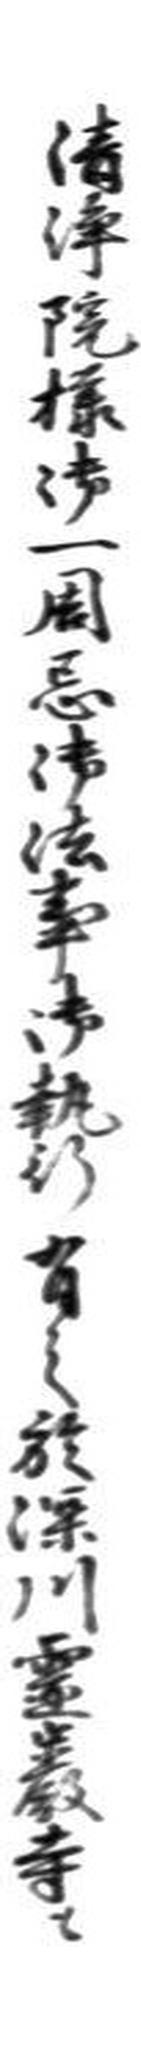清浄院様御一周忌御法事御執行有之於深川霊厳寺も
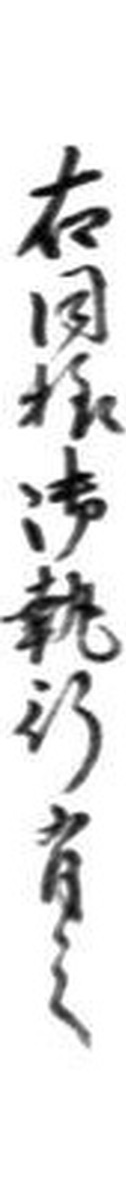右同様御執行有之
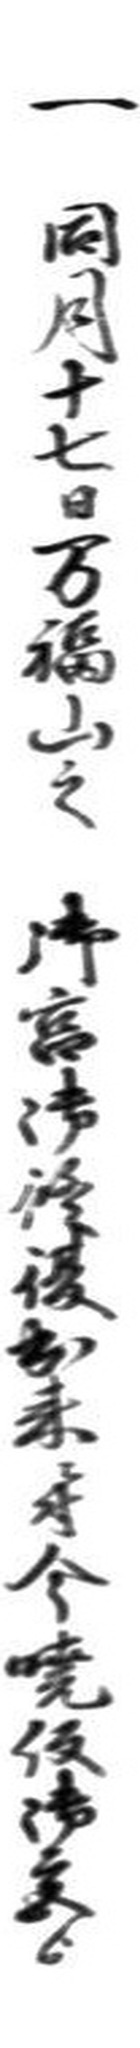一同月十七日万福山之御宮御修復出来ニ付今暁仮御宮ゟ
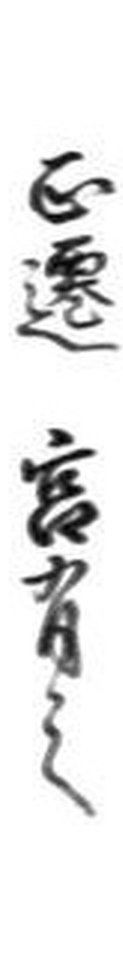正遷宮有之
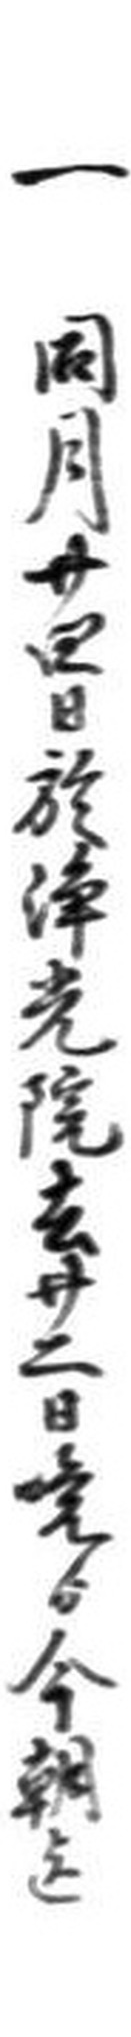一同月廿四日於浄光院去廿二日暁ゟ今朝迄
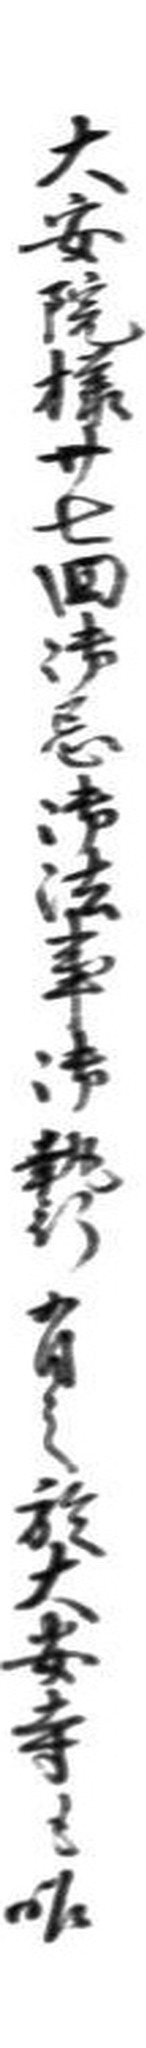大安院様廿七回御忌御法事御執行有之於大安寺も昨
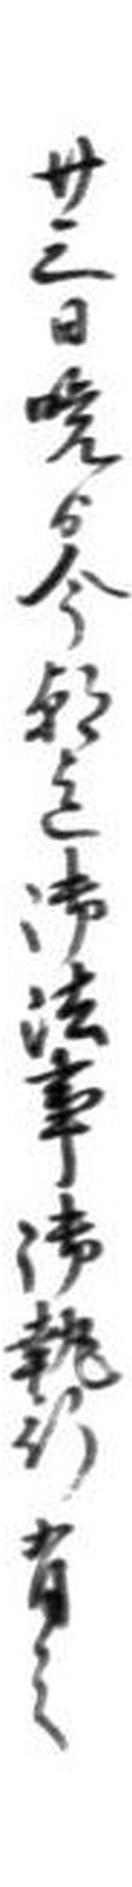廿三日暁ゟ今朝迄御法事御執行有之

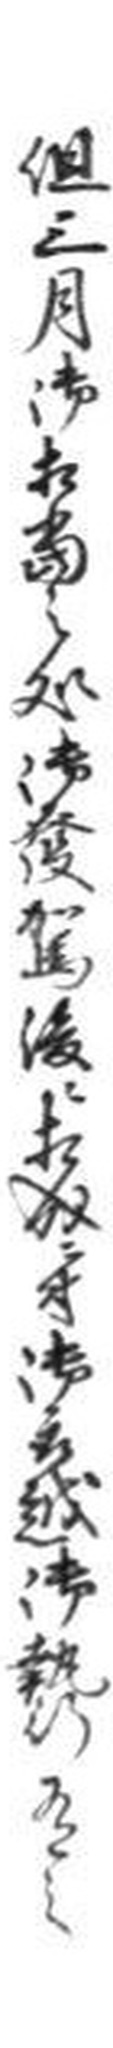但三月御相当之処御発駕後ニ相成ニ付御取越御執行有之
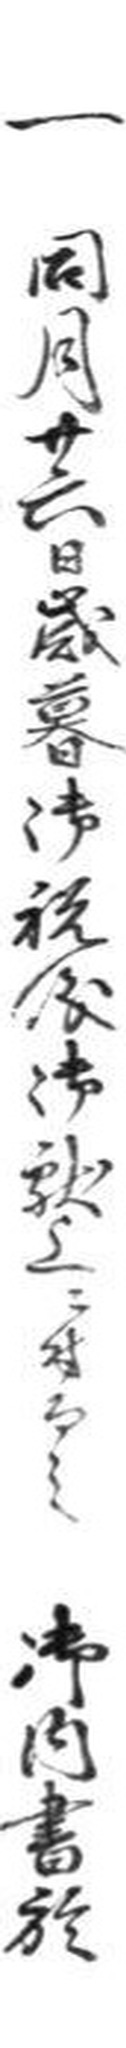一同月廿六日歳暮御祝儀御献上ニ付而之御内書於
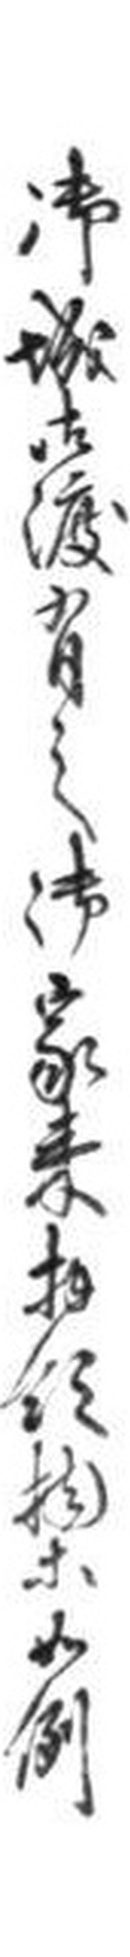御城御渡有之御家来拝領物等如例
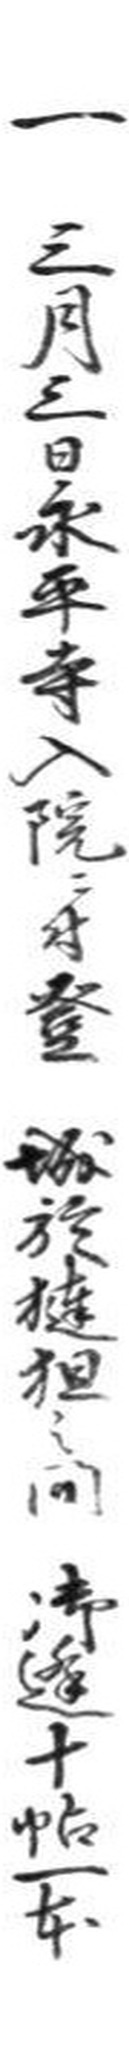一三月三日永平寺入院ニ付登城於韃靼之間御逢十帖一本
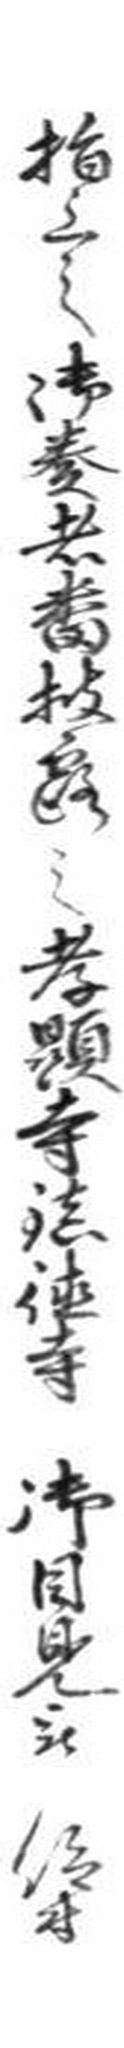指上之御奏者番披露之孝顕寺鎮徳寺御目見被仰付
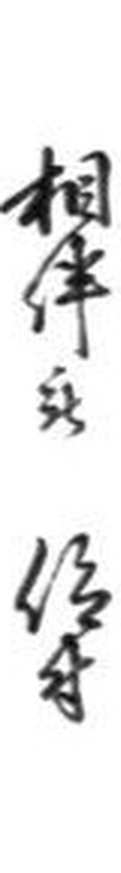相伴被仰付
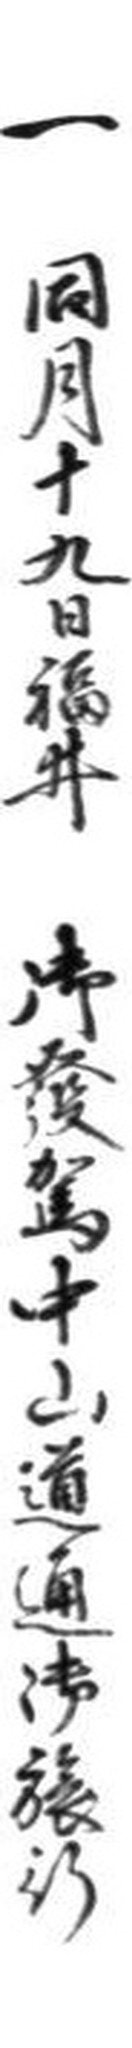一同月十九日福井御発駕中山道通御旅行
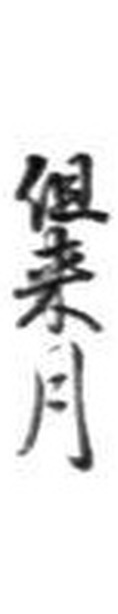但来月
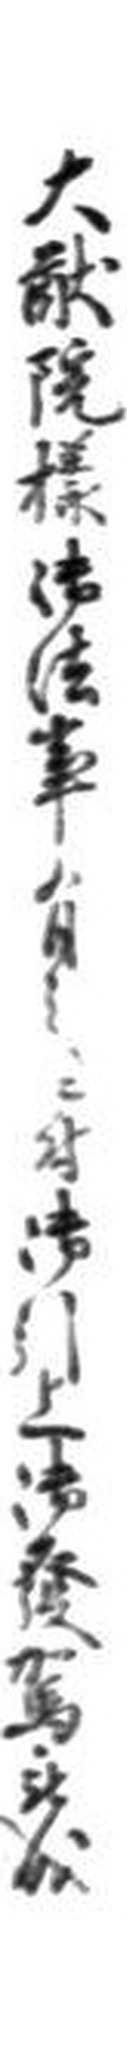大猷院様御法事有之ニ付御引上御発駕被成
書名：家譜 二十一 吉品公 従元禄十三年到同十四年
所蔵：福井県文書館 Fukui Prefectural Archives
